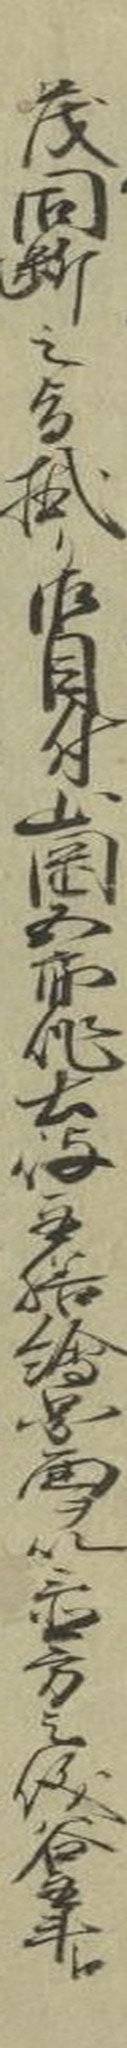も同断之旨掛り御目付山岡五郎作土岐主膳絵図面を以置方之儀谷主計え
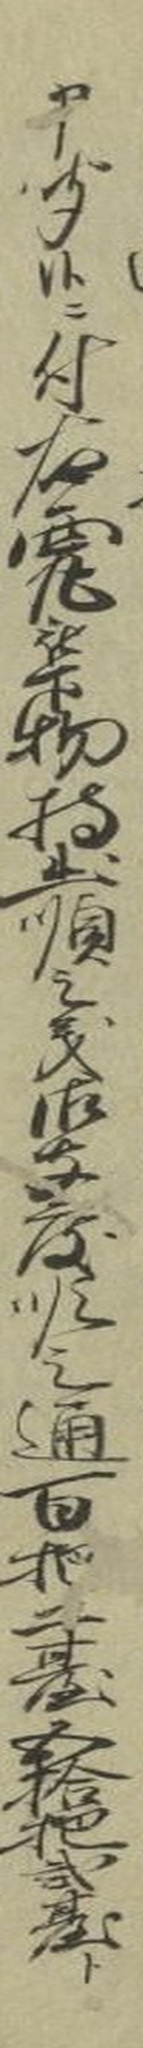申聞候に付右西丸被下物持出順之義御支度順之通百把二台五拾把弐台と
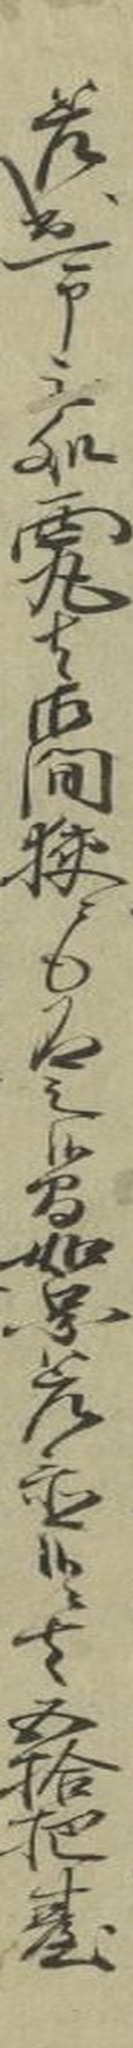差出可申之処西丸は御間狭にも有之候間如図差置候には五拾把台
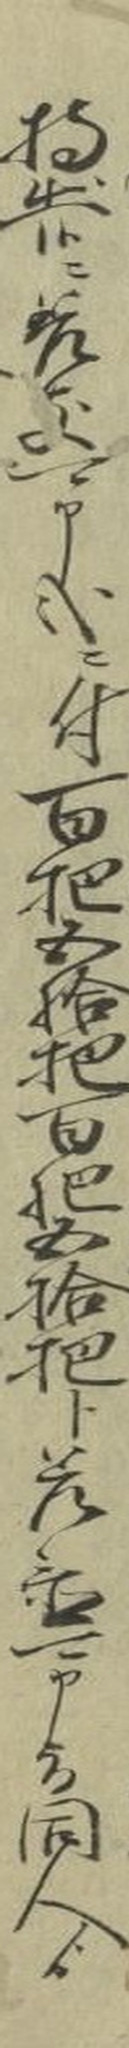持出候に差支可申哉に付百把五拾把百把五拾把と差置可申旨同人ゟ
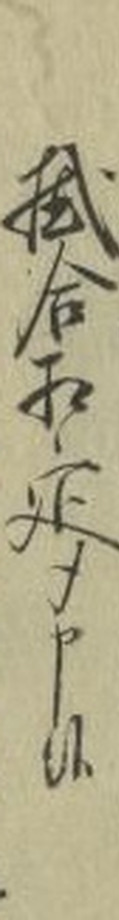掛合相定め申候
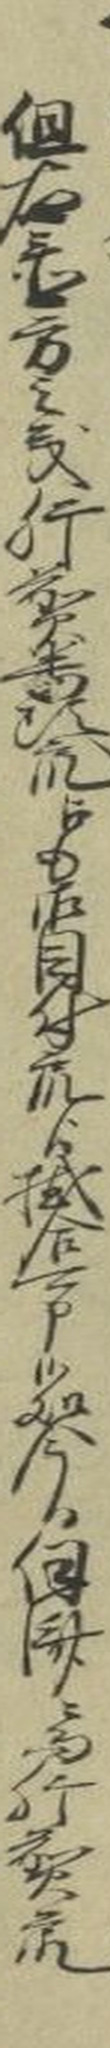但右置方之義肝煎番頭衆えも御目付衆ゟ掛合可申候処今日伺済にて肝煎衆
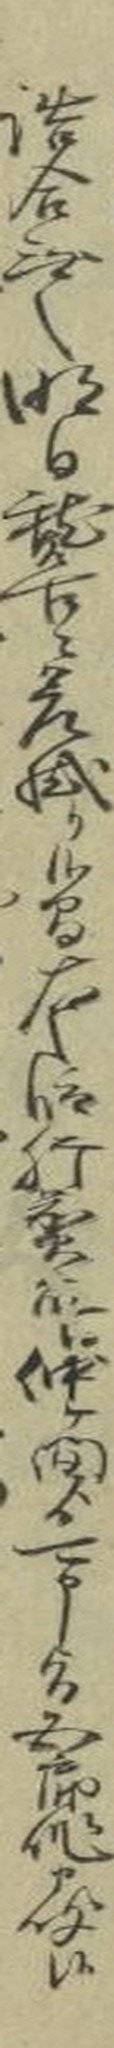詰合無之明日稽古に差掛り候間右之段肝煎衆え仲か間ゟ可申旨五郎作申聞候
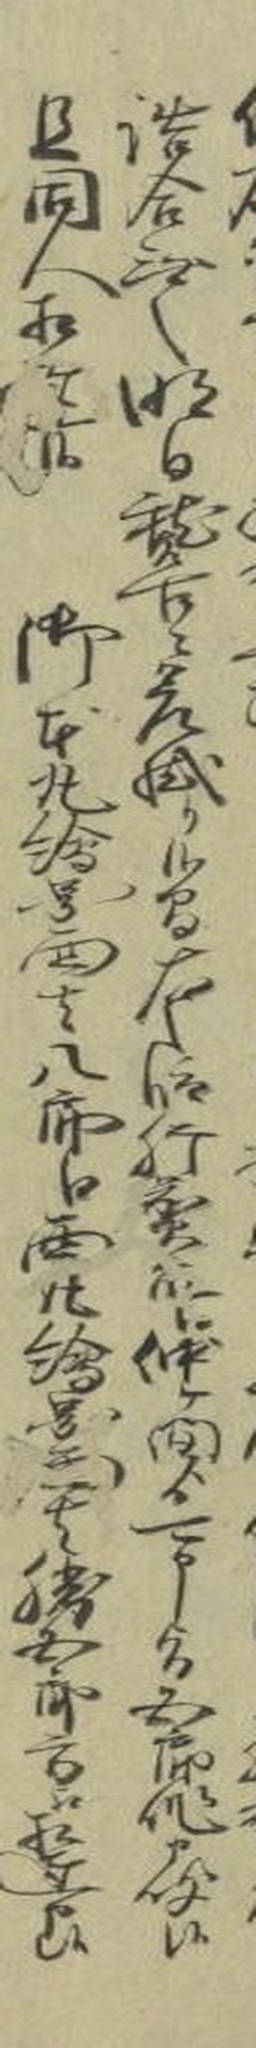且同人相御本丸絵図面は八郎え西丸絵図面は勝五郎方え相達申候
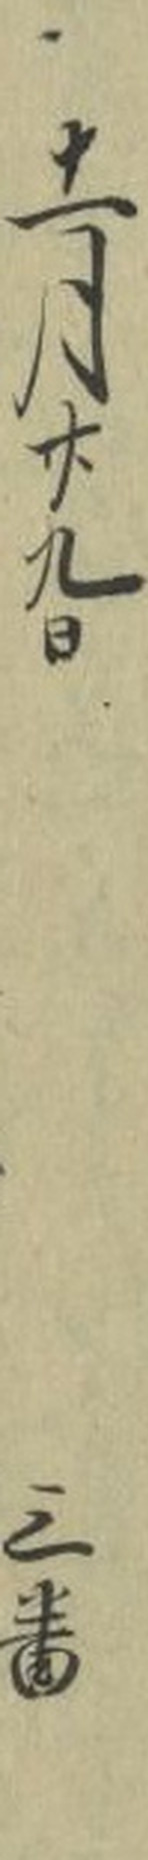十一月廿九日三番
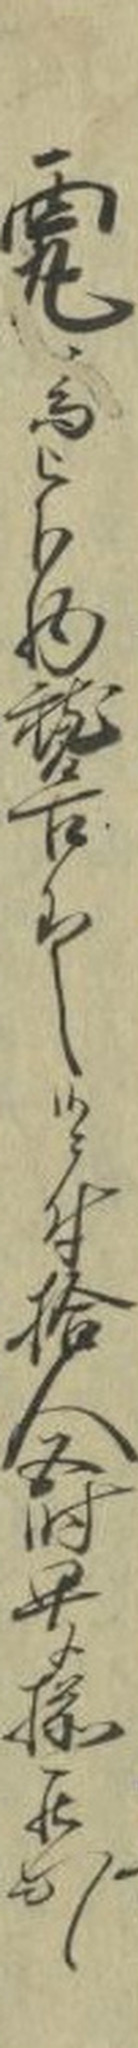一西丸にて被下物稽古有之候に付拾人五時早め揃罷出候
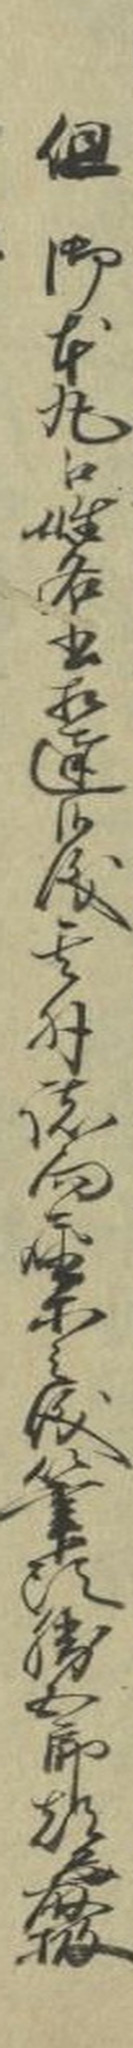但御本丸え姓名書相達候儀其外諸向届等之儀筆頭勝五郎都て取扱
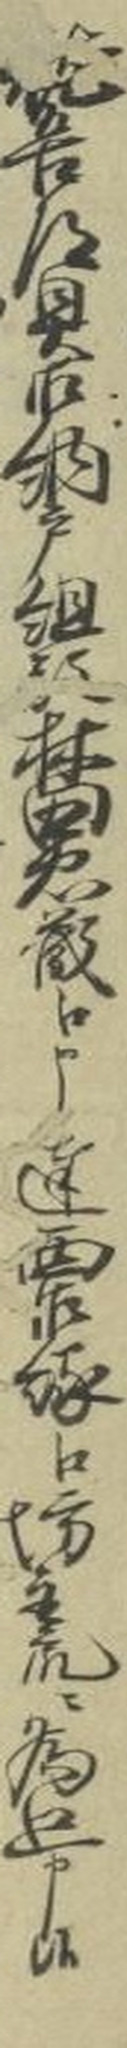一稽古道具御納戸組頭林田忠蔵え申達西御縁え坊主衆に為廻申候
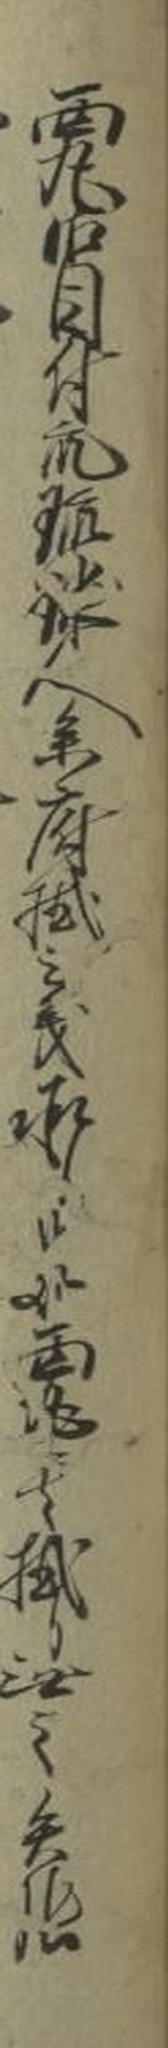一西丸御目付衆琉球人参府掛之義承候処西丸には掛り無之矢張
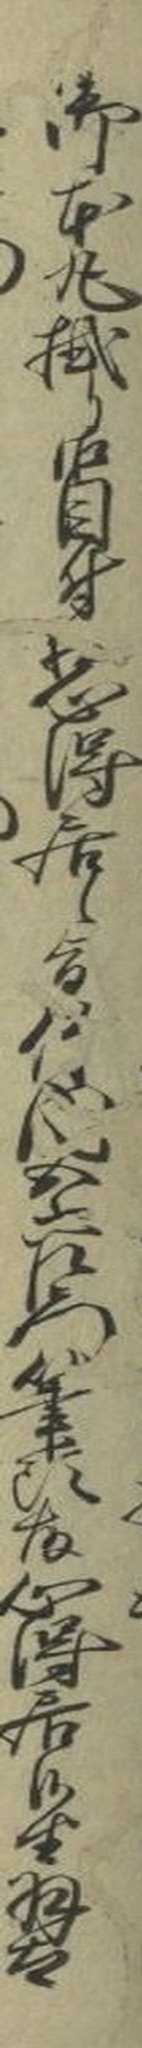御本丸掛り御目付相心得居候旨竹内五六左衛門筆頭故心得居候由羽太
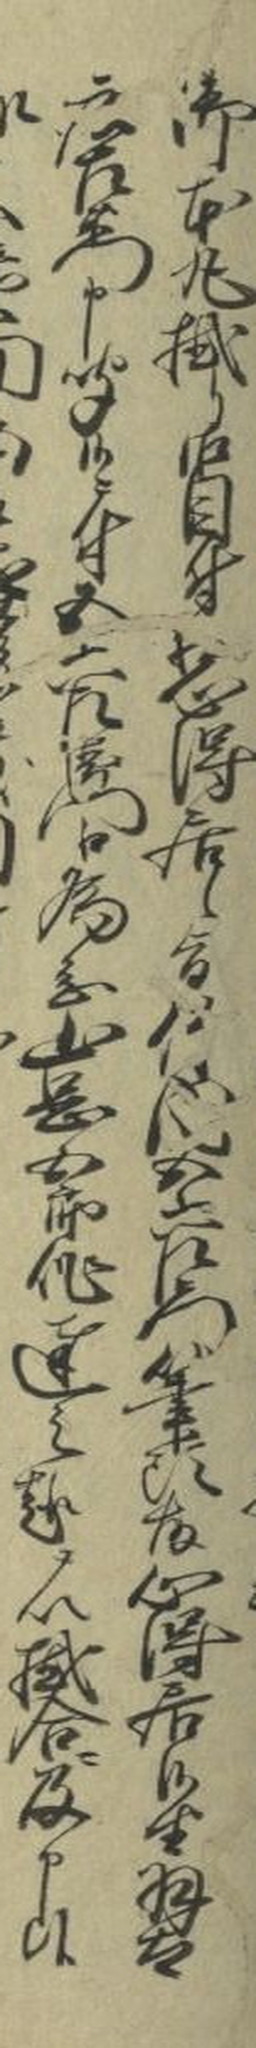忠左衛門申聞候に付五六左衛門え為念山岡五郎作達之趣を以掛合に及申候
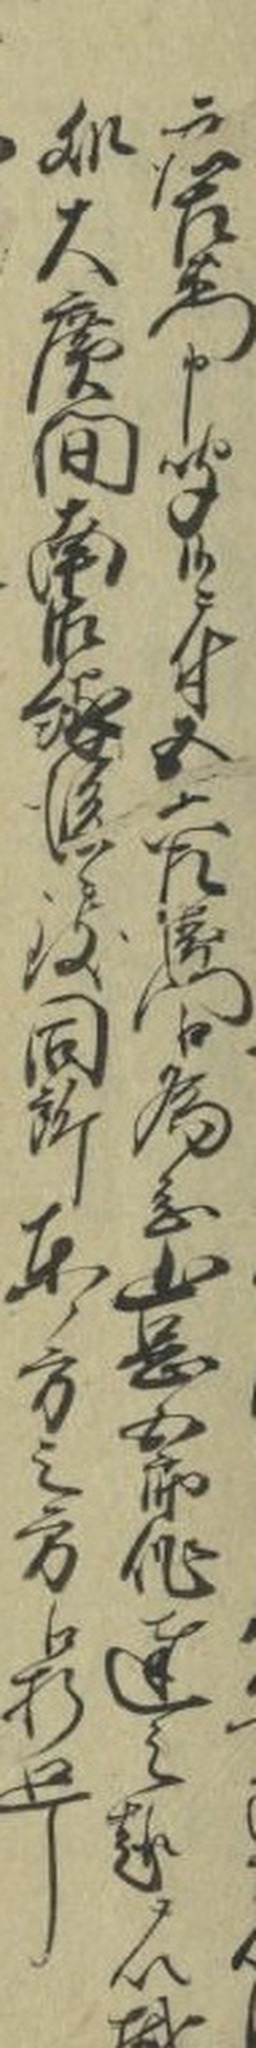処大広間南御縁後に致同所東の方之方え相廻し
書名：天保三壬辰年琉球人参府之節勤方書留
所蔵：University of the Ryukyus Library
